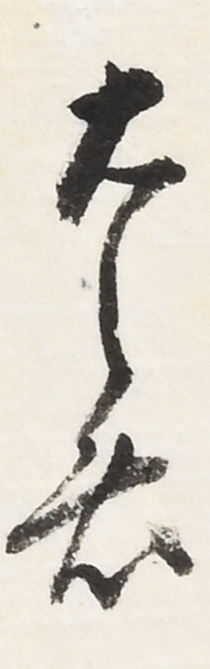右之者
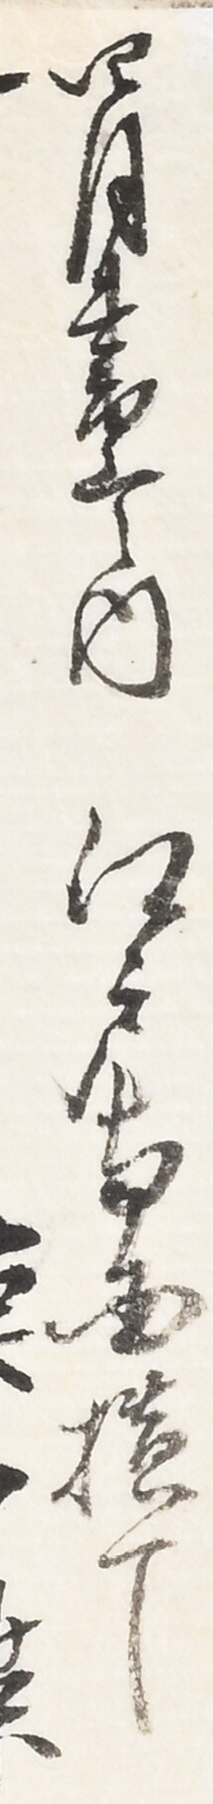四月書上之内江戸両国横丁
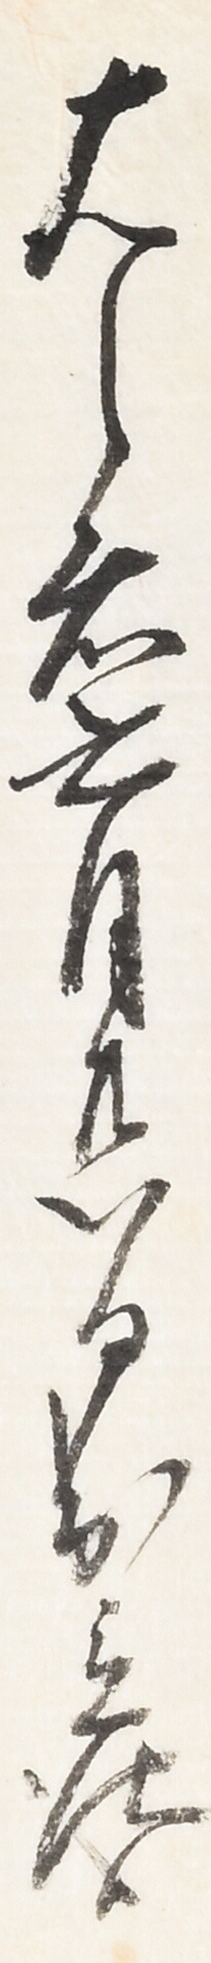右之者六月廿八日出立仕候
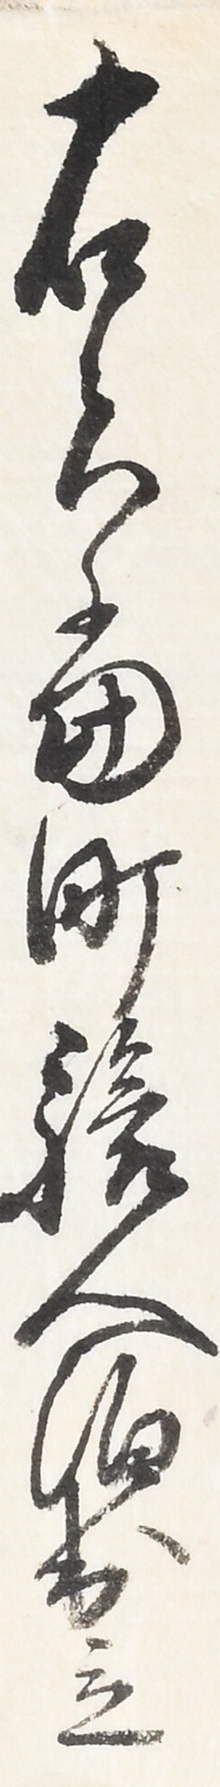右之者当町旅人泊出立
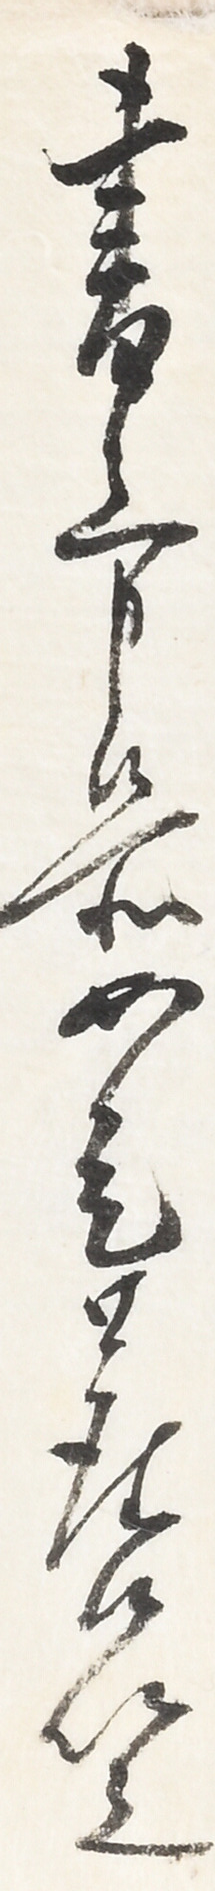書上申候所如是御座候以上
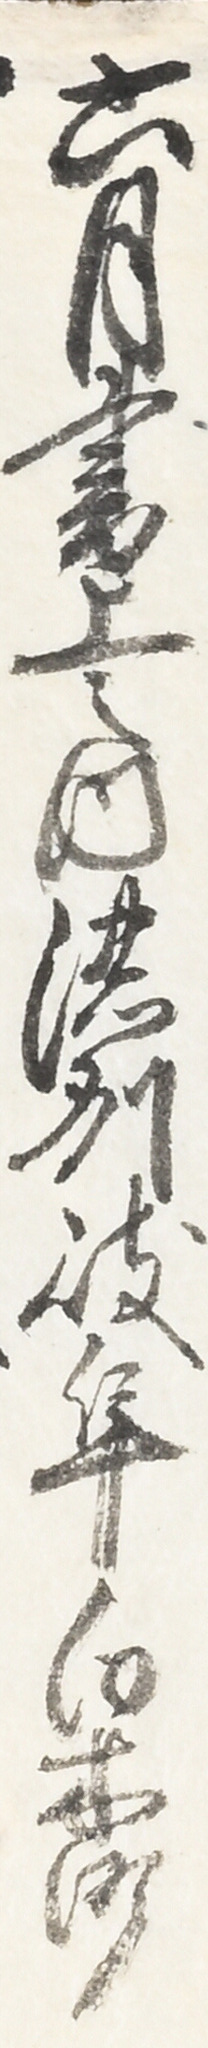六月書上之内濃州岐阜白木町
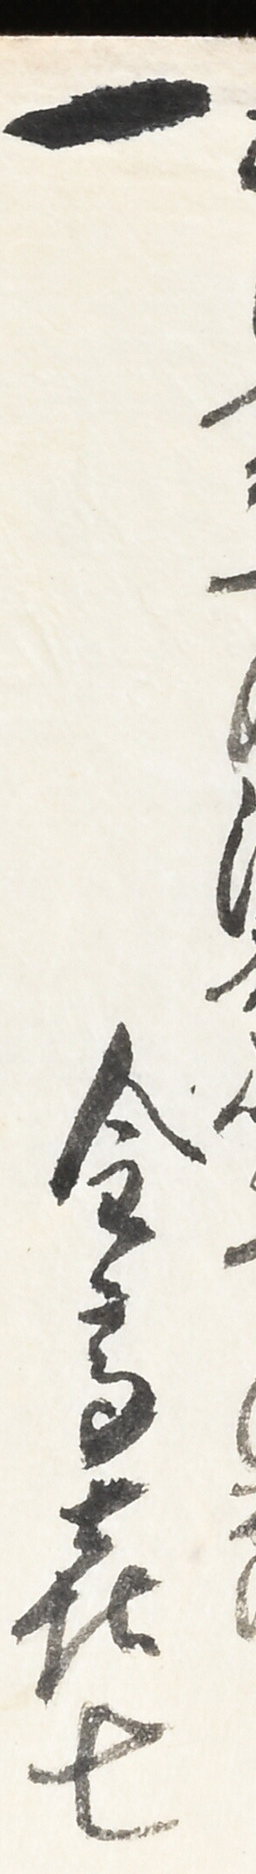一金高喜七
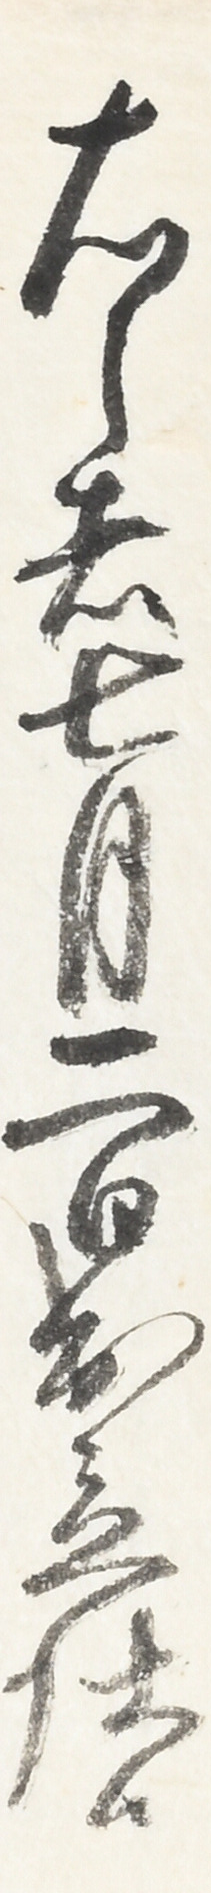右之者七月二日出立仕候
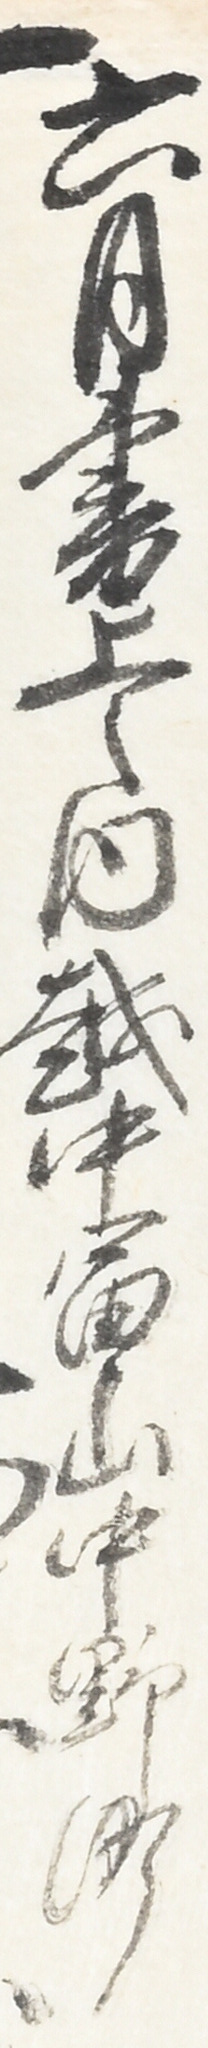六月書上之内越中冨山中野町
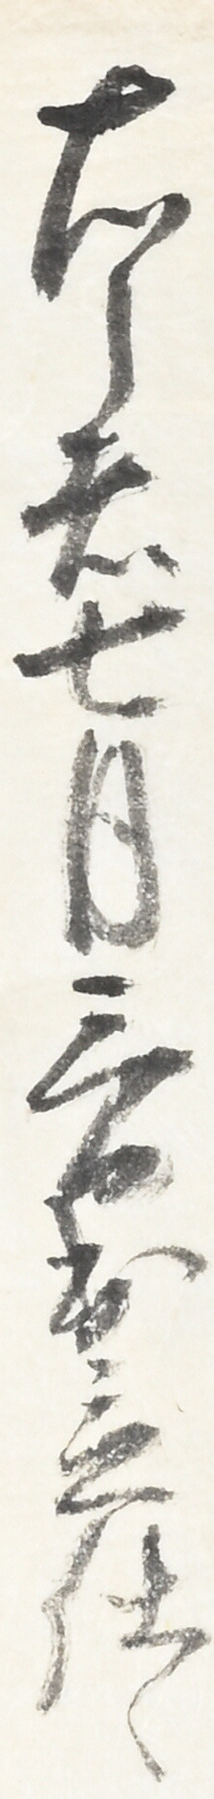右之者七月三日出立仕候

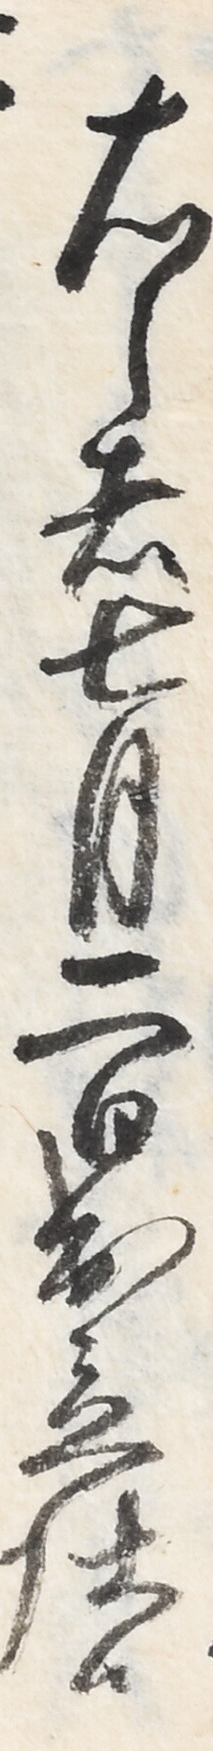右之者共同十二日出立仕候
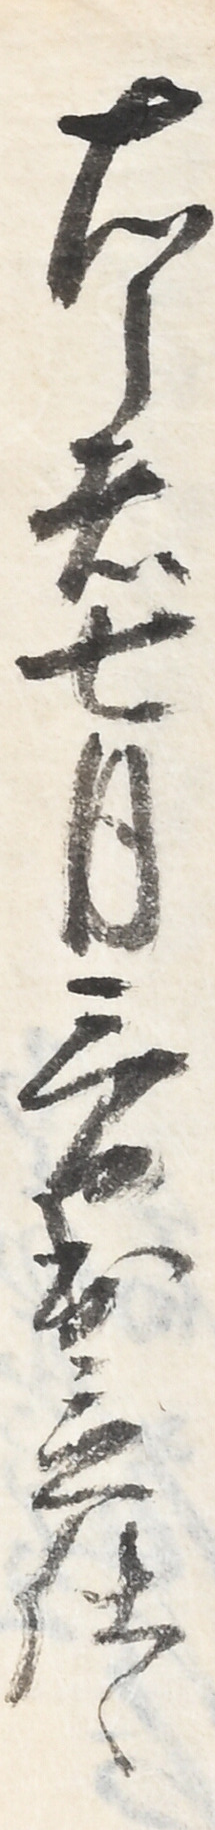右之者共廿四日出立仕候
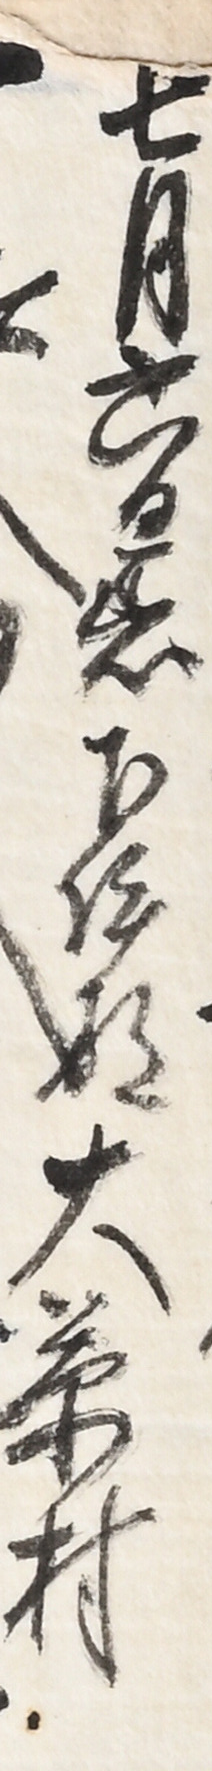七月六日着下伊那大草村
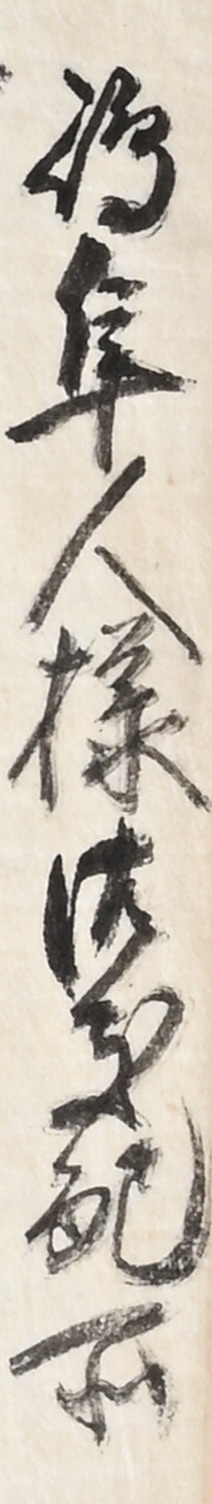嶋隼人様御支配所
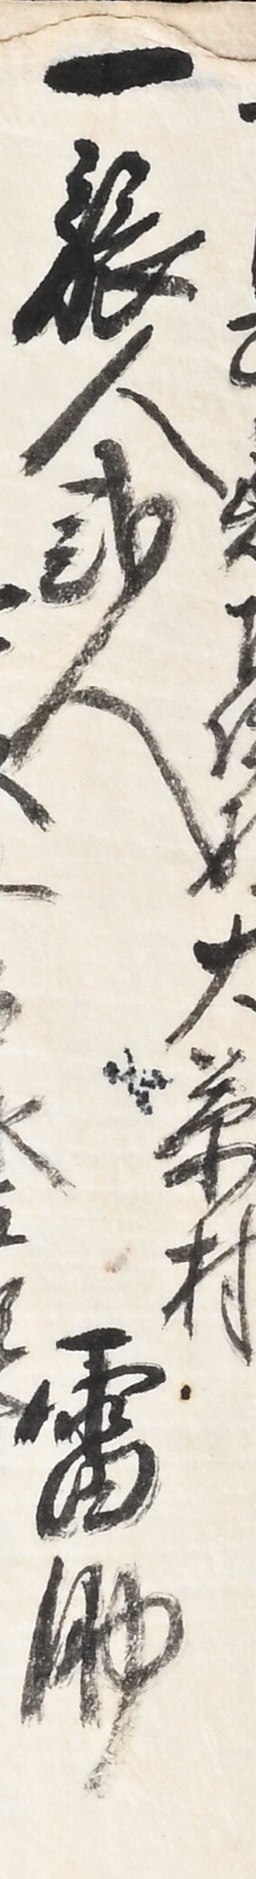一旅人弐人雷助
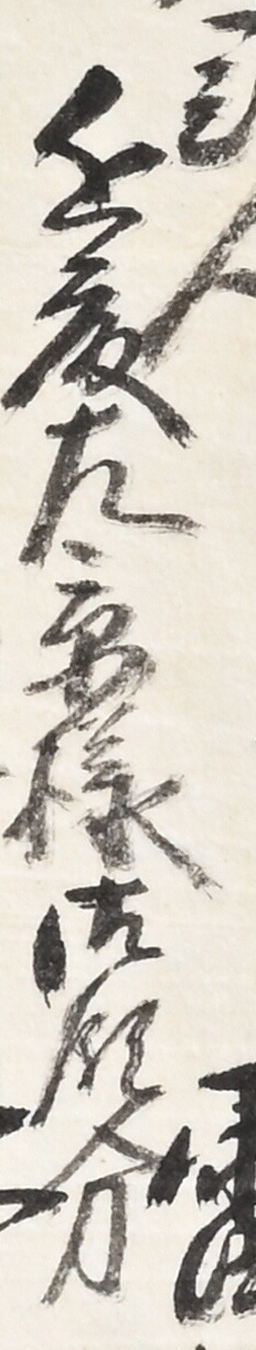近藤左京様御領分
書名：旅人泊控帳
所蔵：伊那市立高遠町図書館・合同会社AMANE
